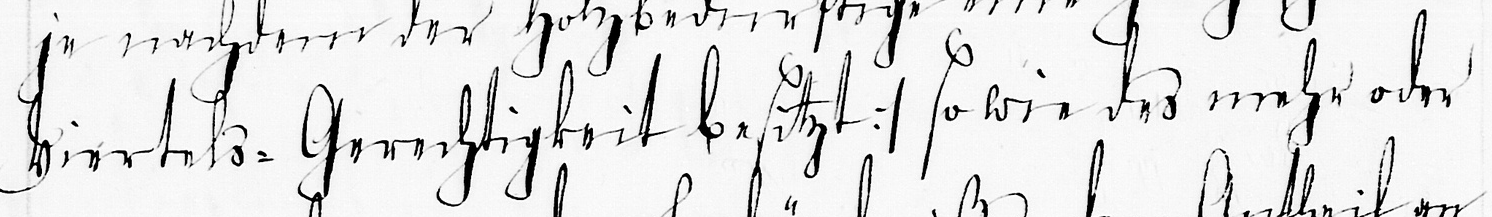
Viertels-Gerechtigkeit besitzt] so wie des mehr oder
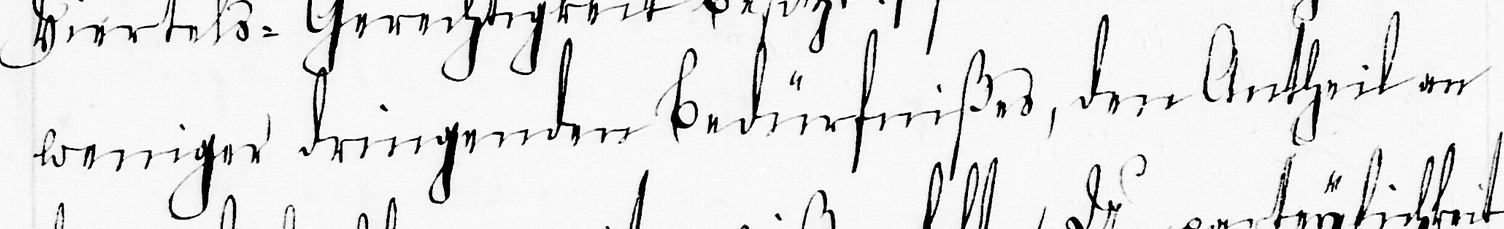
weniger dringenden Bedürfnißes, den Antheil an
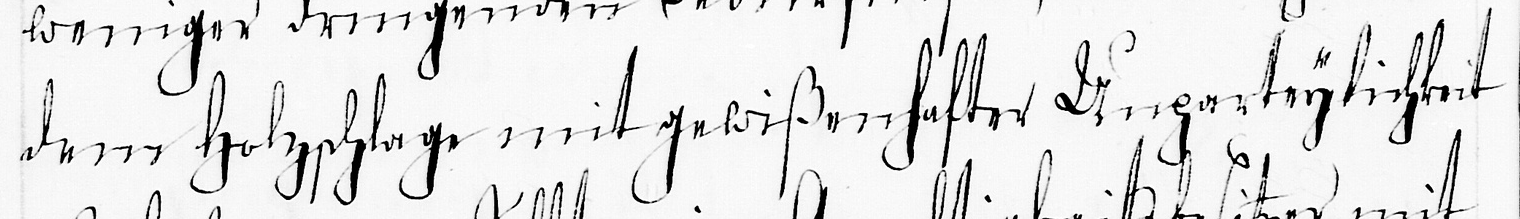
dem Holzschlage mit gewißenhafter Unparteylichkeit
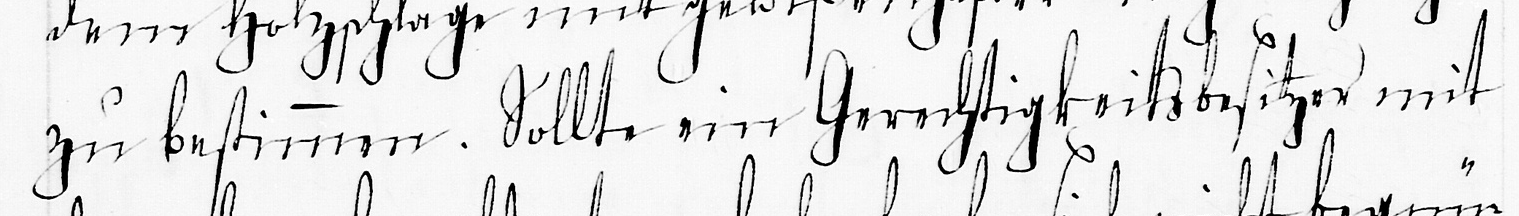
zu bestimmen. Sollte ein Gerechtigkeitsbesitzer mit
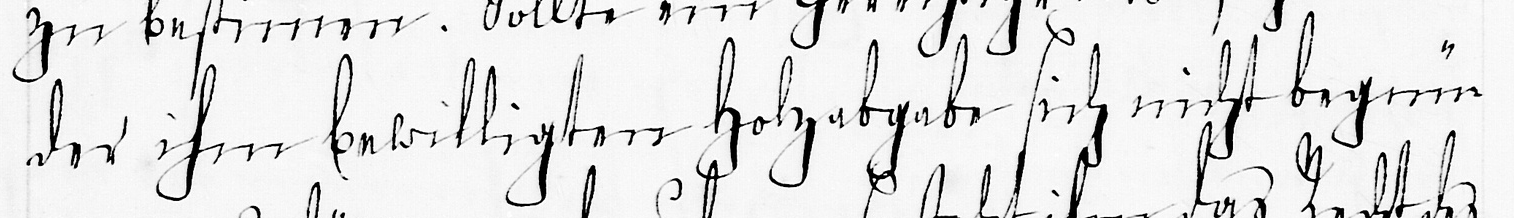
der ihm bewilligten Holzabgabe sich nicht begnü¬
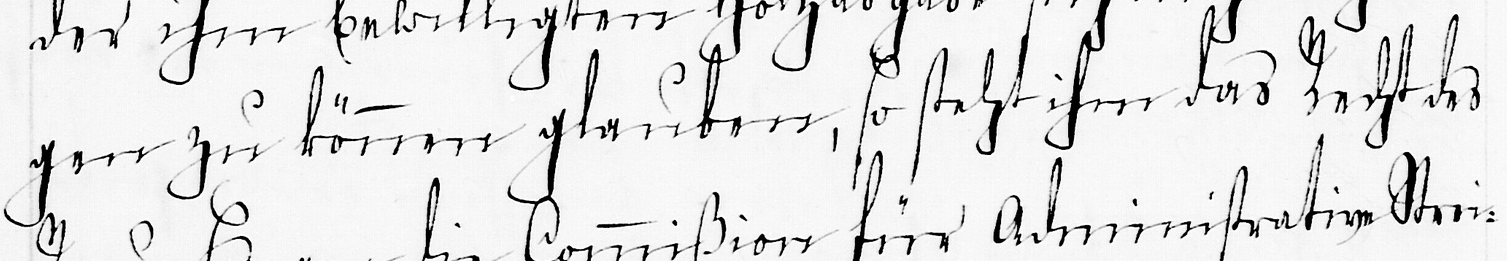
gen zu können glauben, so steht ihm das Recht des
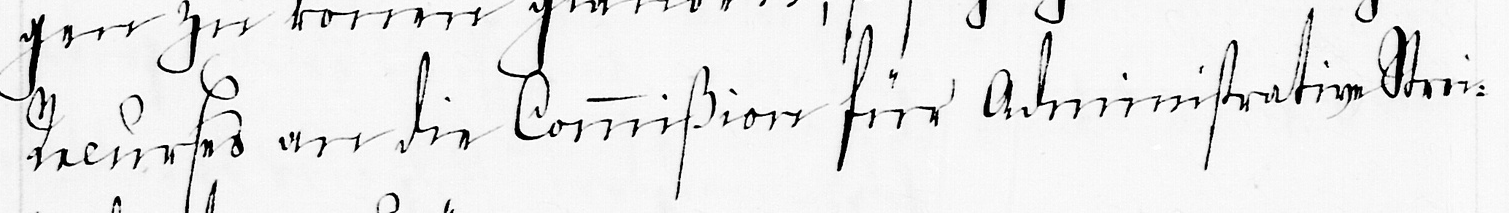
Recurses an die Commißion für Administrative Strei¬
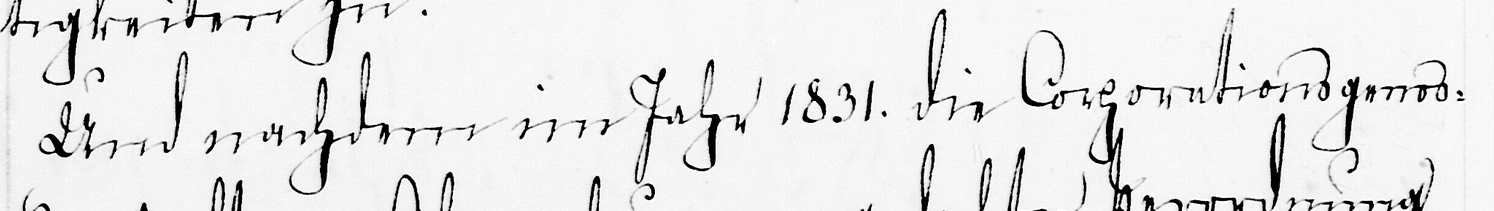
Und nachdem im Jahr 1831. die Corporationsgenoß¬
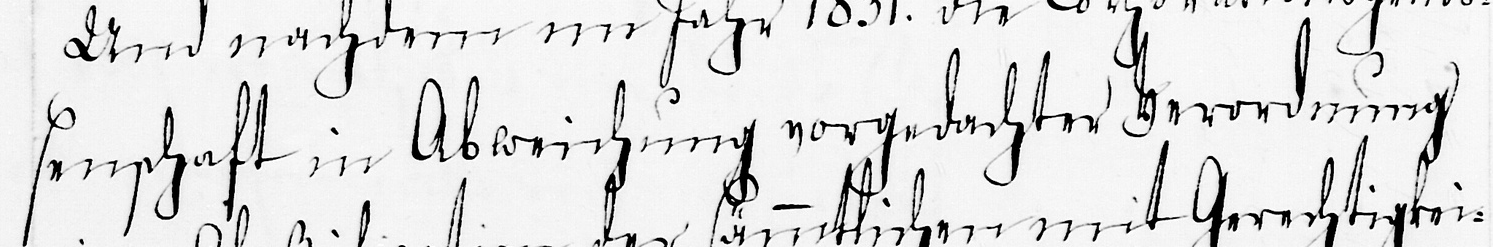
enschaft in Abweichung vorgedachter Verordnung
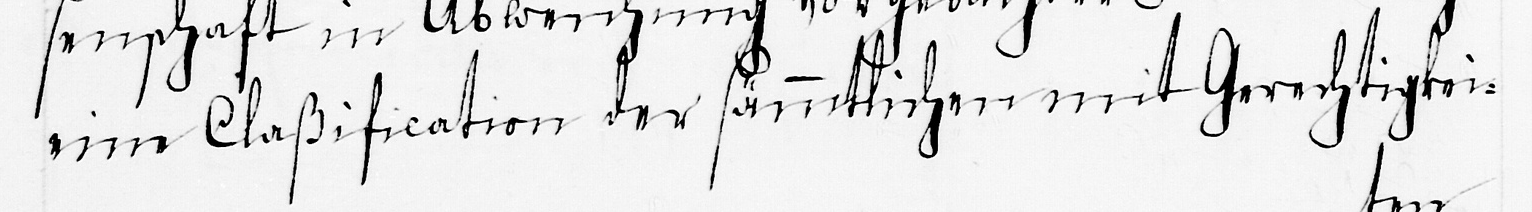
eine Claßification der sämmtlichen mit Gerechtigkei-
